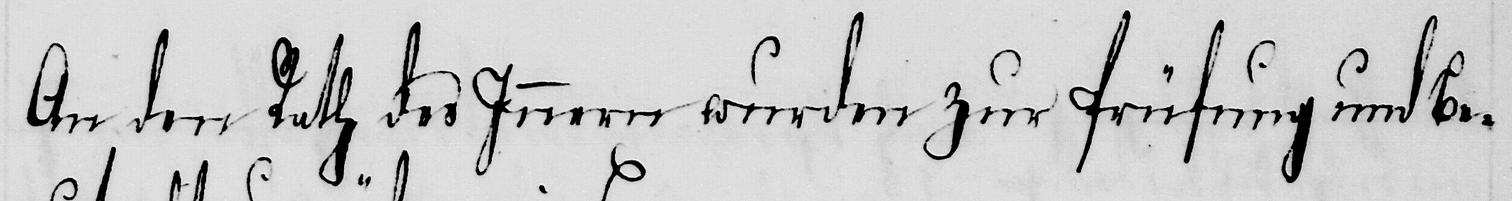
An den Rath des Innern wurden zur Prüfung und Be¬
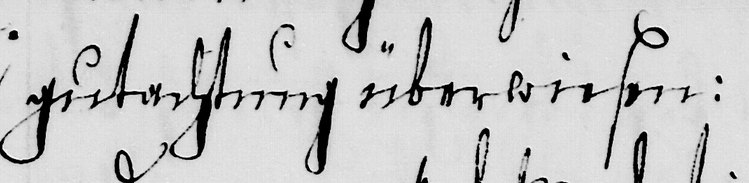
gutachtung überwiesen:
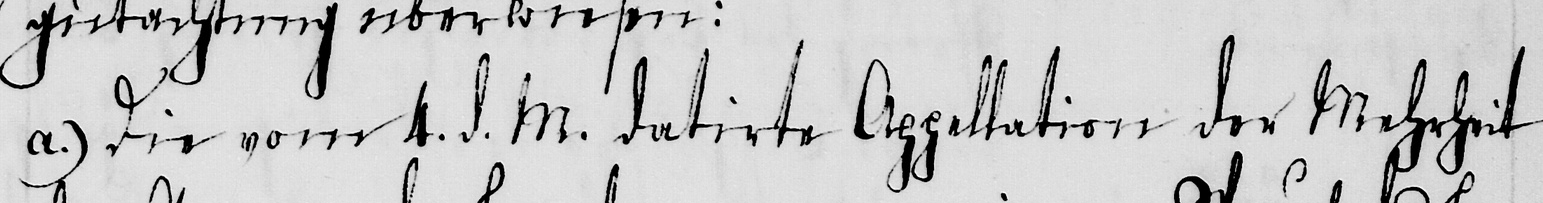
a.) Die vom 4. d. M. datirte Appellation der Mehrheit
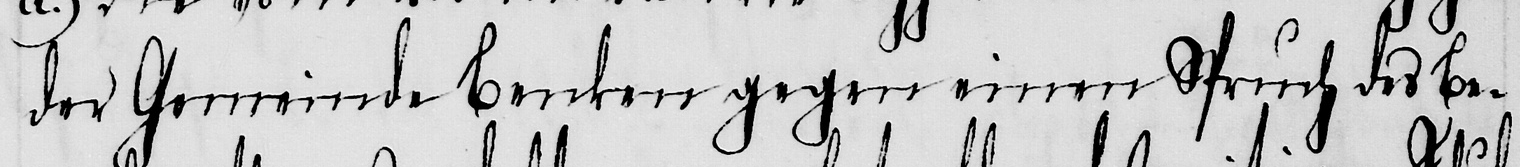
der Gemeinde Benken gegen einen Spruch des Be¬
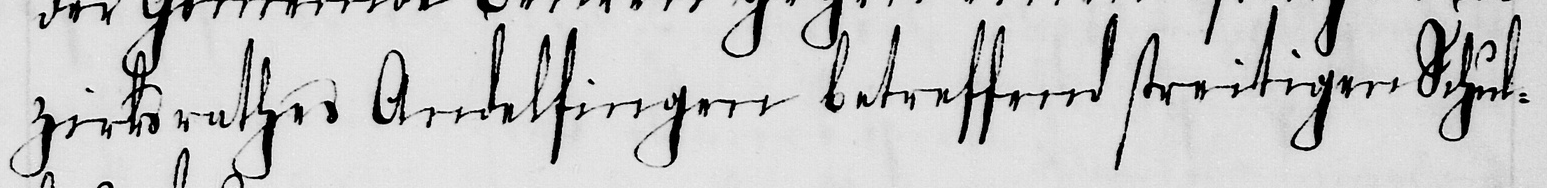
zirksrathes Andelfingen betreffend streitigen Schul¬
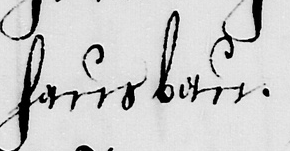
hausbau.
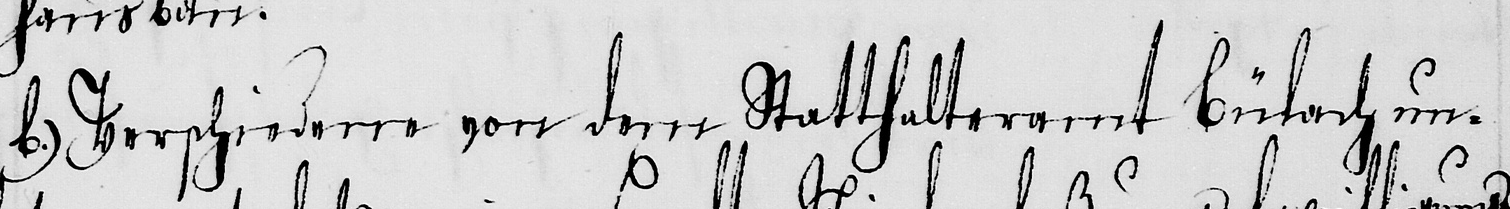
b.) Verschiedene von dem Statthalteramt Bülach un¬
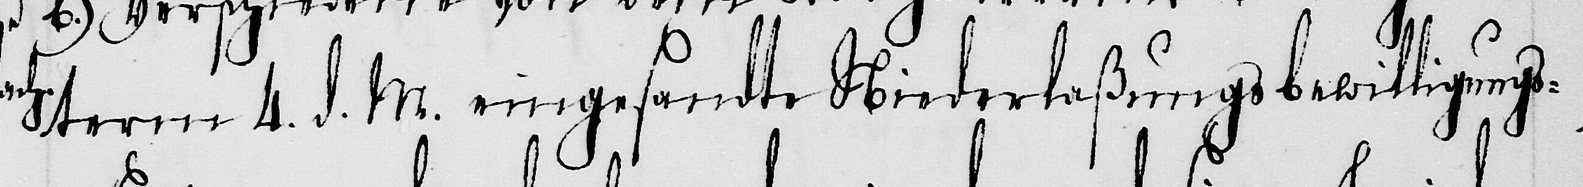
term 4. d. M. eingesandte Niederlaßungsbewilligungs¬
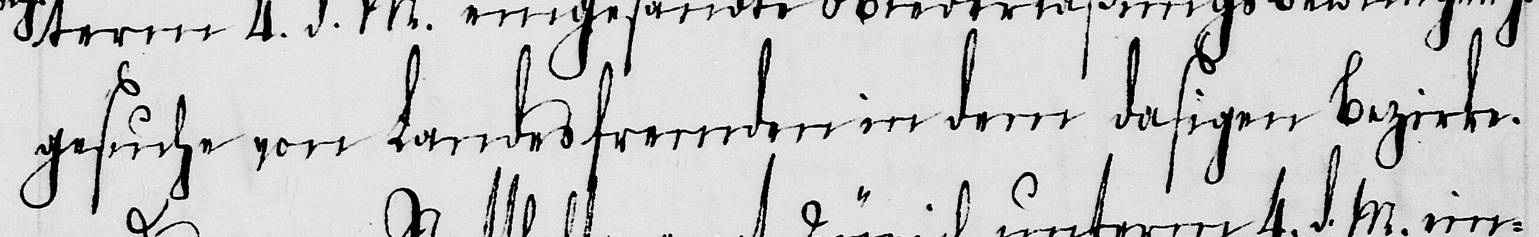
gesuche von Landesfremden in dem dasigen Bezirke.
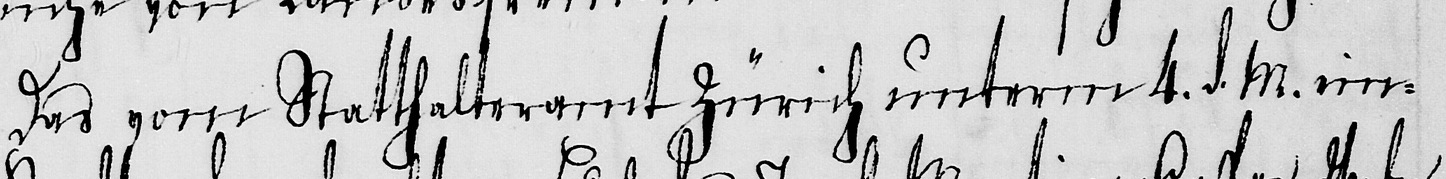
Das vom Statthalteramt Zürich unterm 4. d. M. ein¬
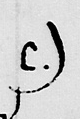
e.)
